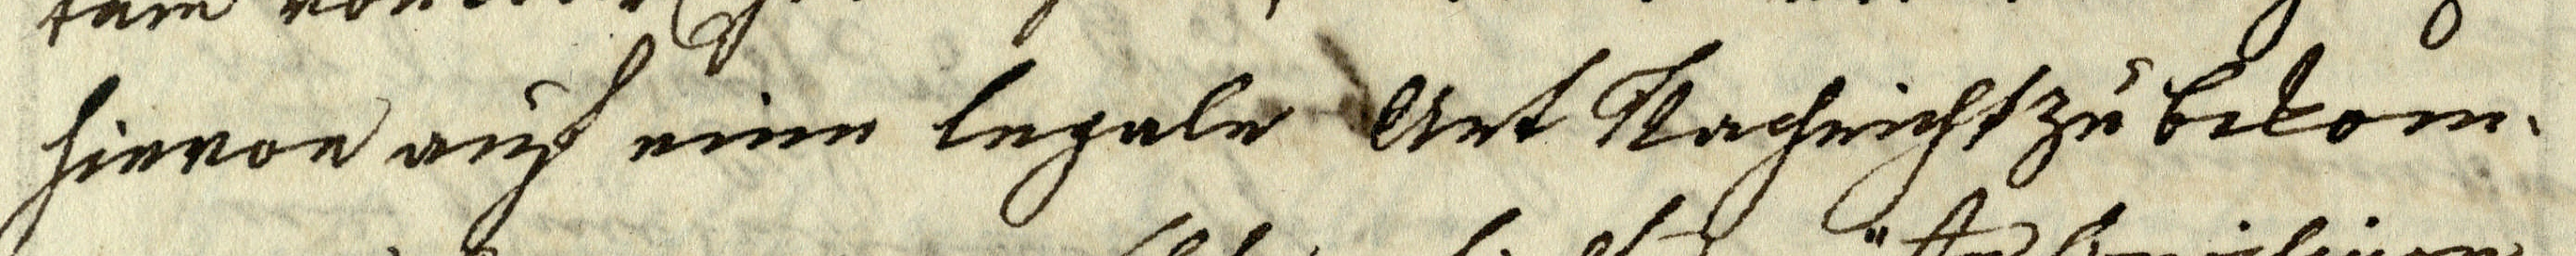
hievon auf eine legale Art Nachricht zu bekom¬
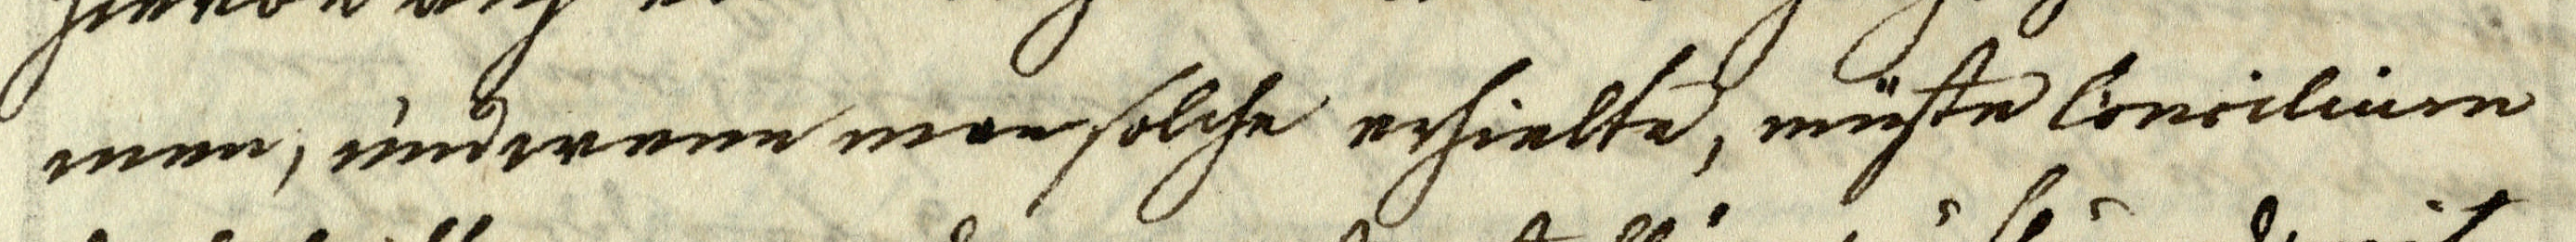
men, und wenn man solche erhielte, müste Concilium
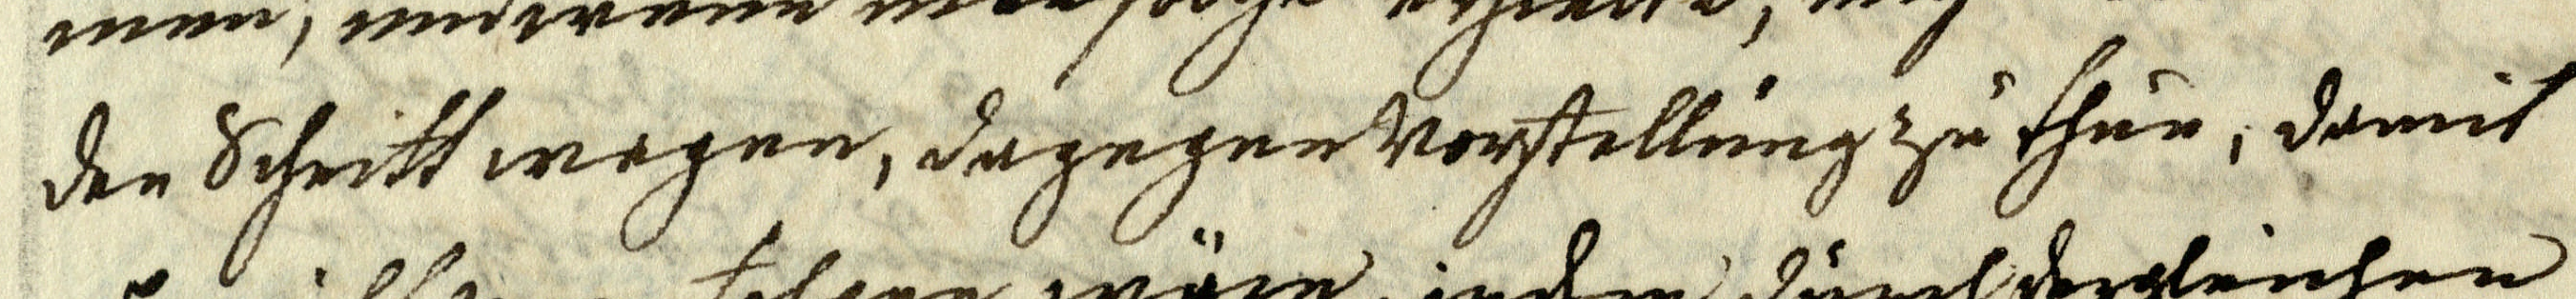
den Schritt wagen, dagegen Vorstellung zu thun, damit
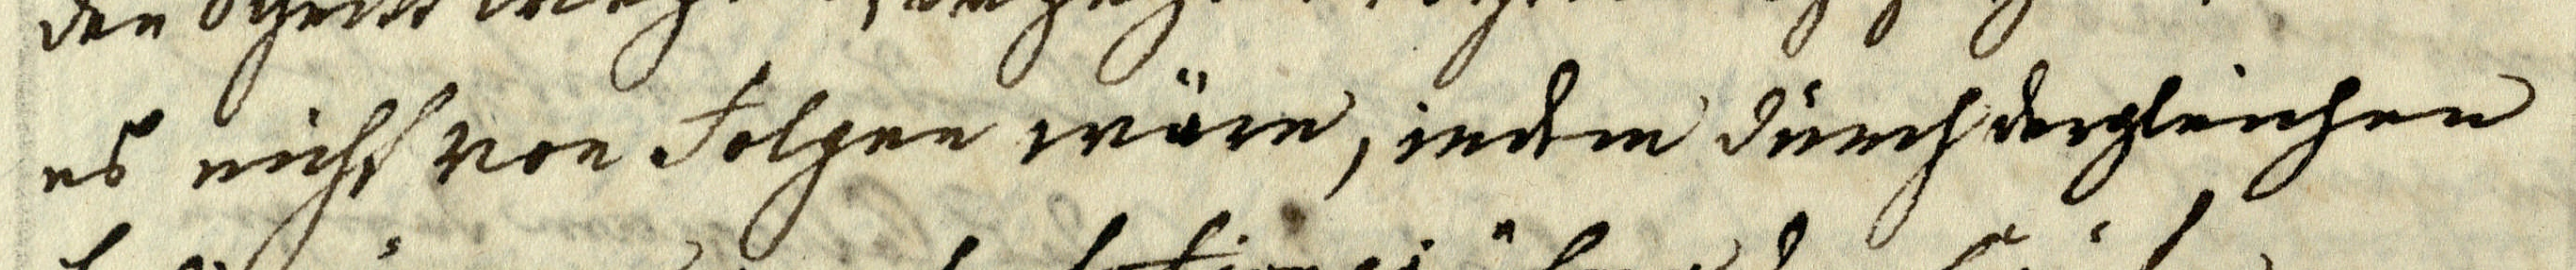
es nicht von Folgen wäre, indem durch dergleichen
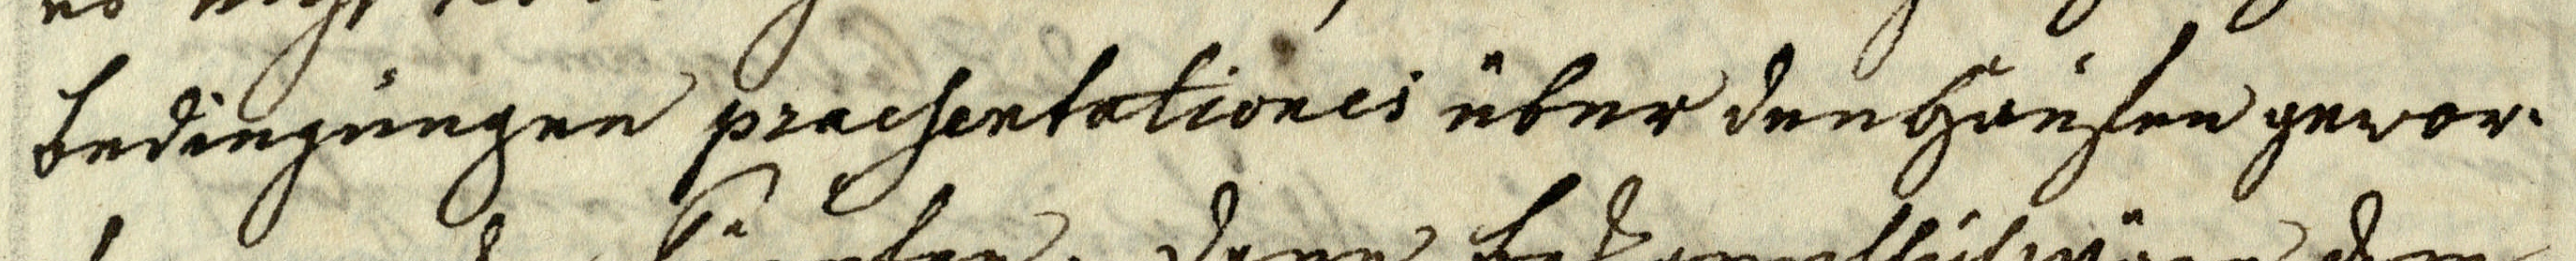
Bedingungen praesentationes über den Haufen gewor¬
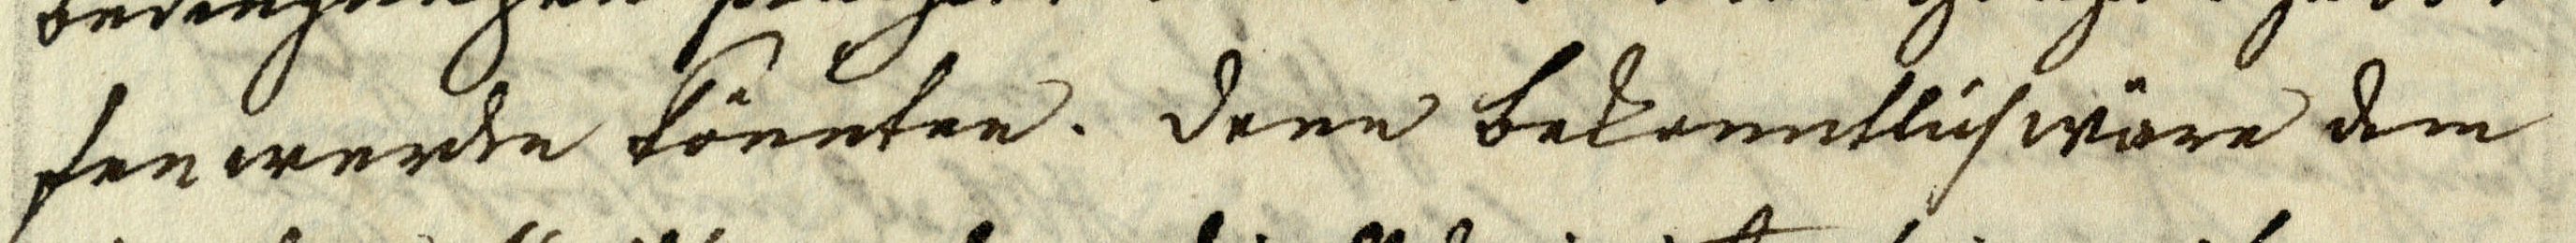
fen werden könnten. Denn bekanntlich wäre dem
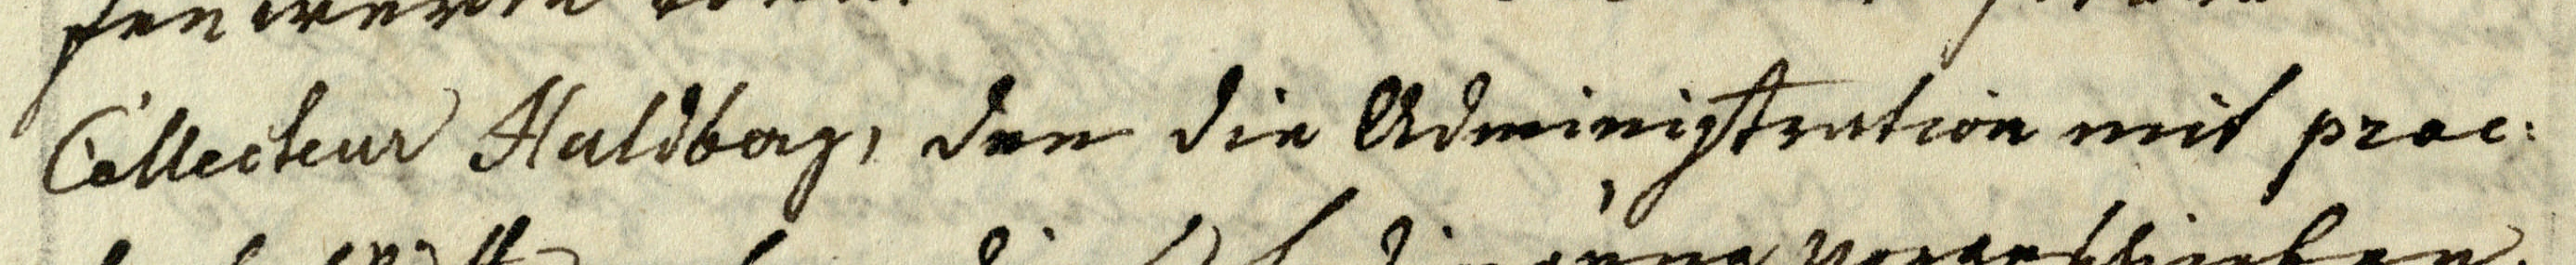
Collecteur Huldberg, den die Administration mit prae¬
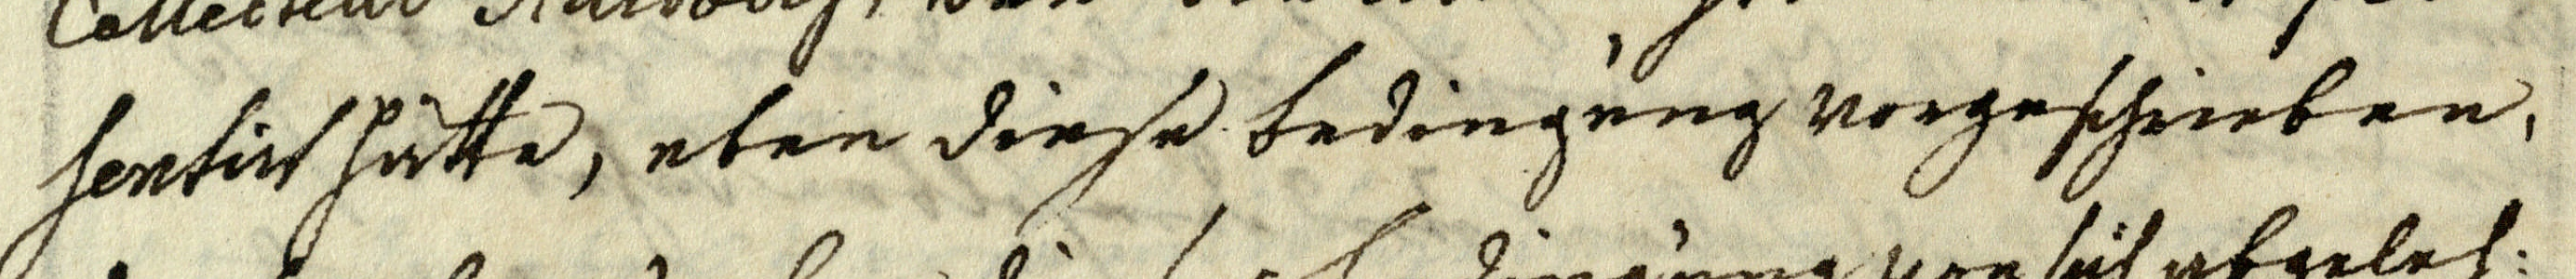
sentirt hätte, eben diese Bedingung vorgeschrieben,
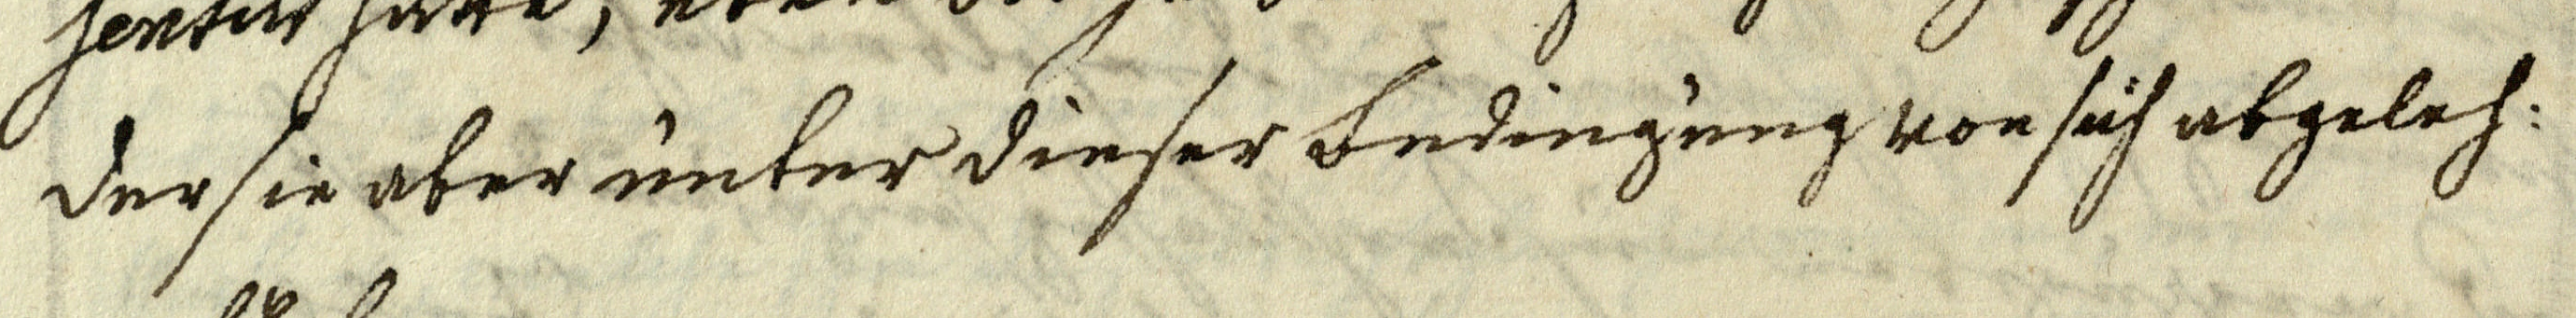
der sie aber unter dieser Bedingung von sich abgeleh¬
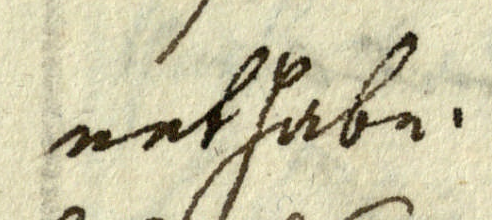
net habe.
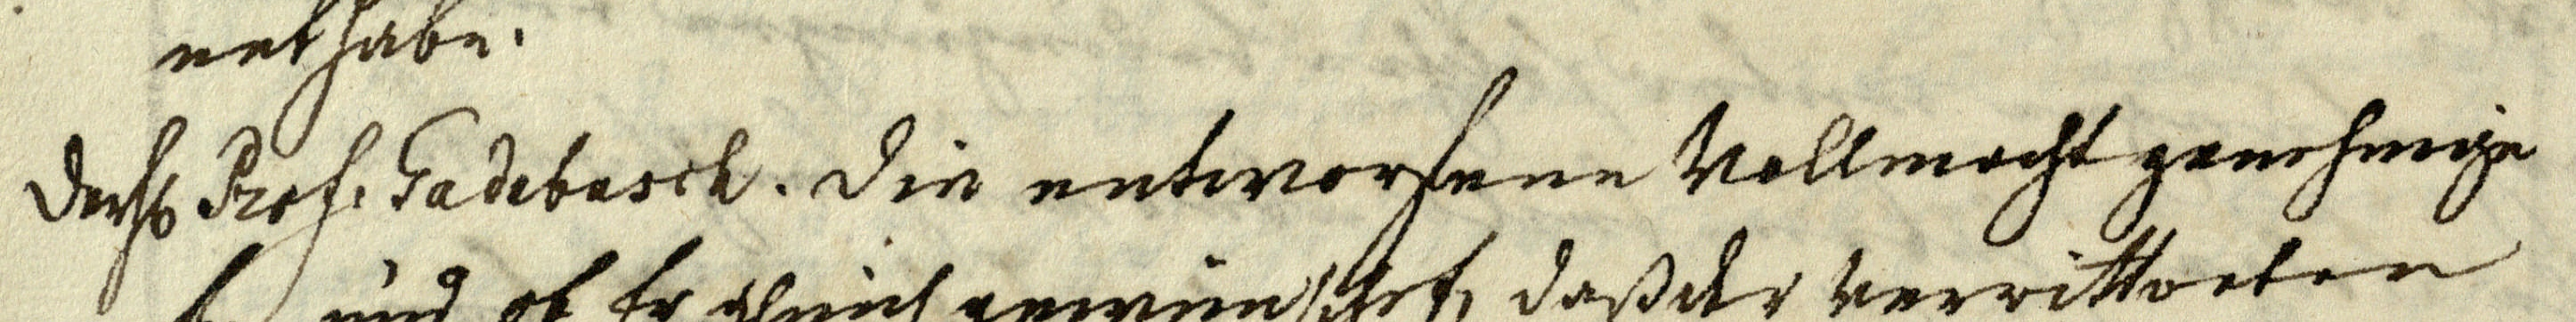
derh Prof. Gadebusch. Die entworfene Vollmacht genehmige
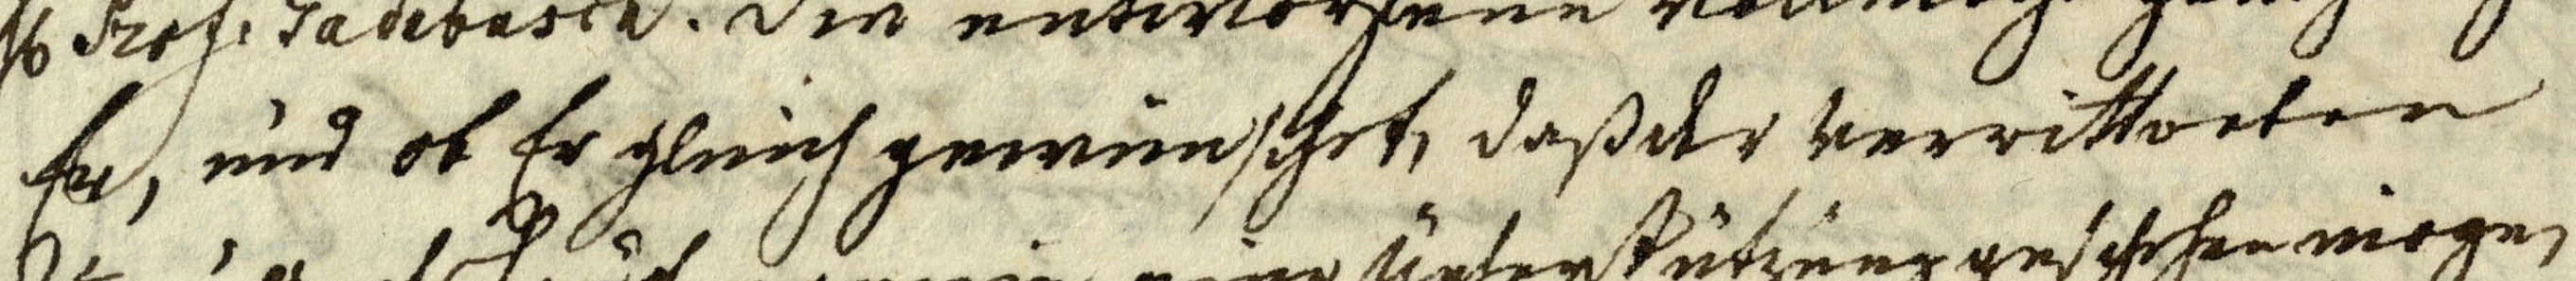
Er, und ob Er gleich gewünschet, daß der verwittweten
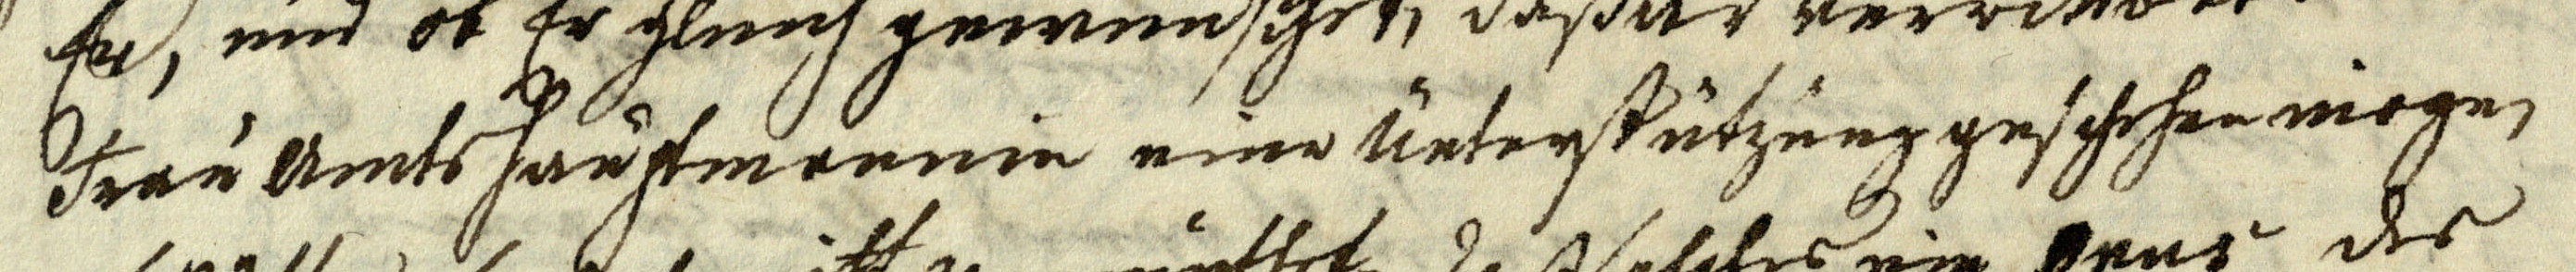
Frau Amtshauptmannin eine Unterstützung geschehen möge,
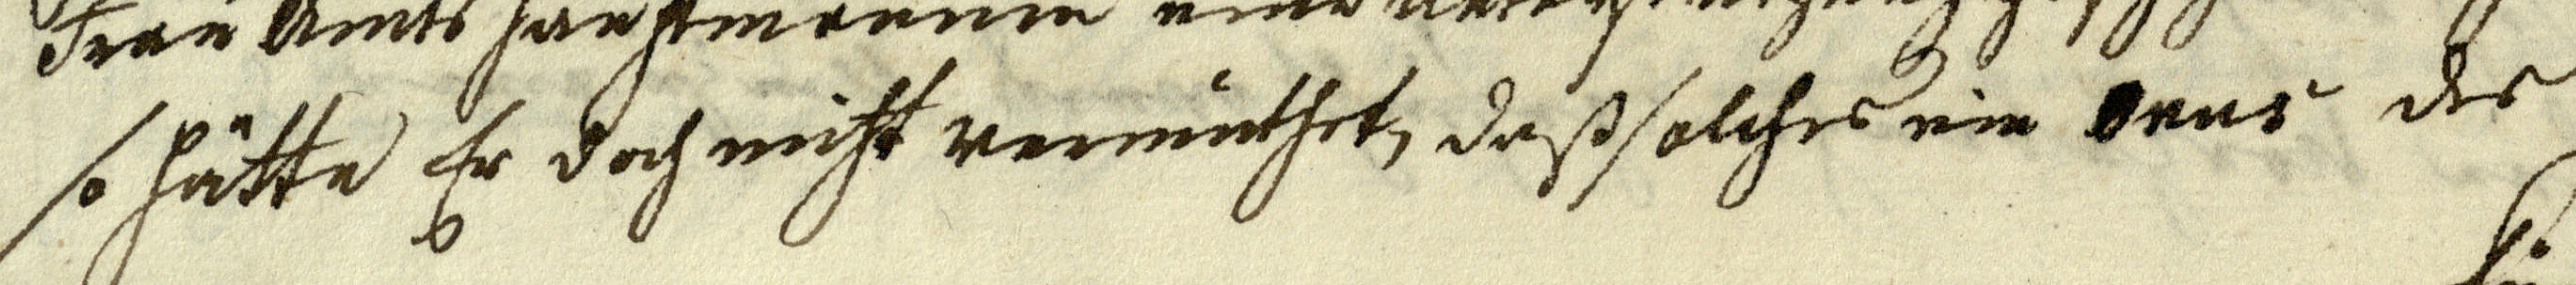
so hätte Er doch nicht vermuthet, daß solches ein Onus des
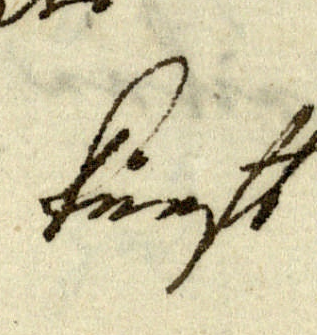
künft
